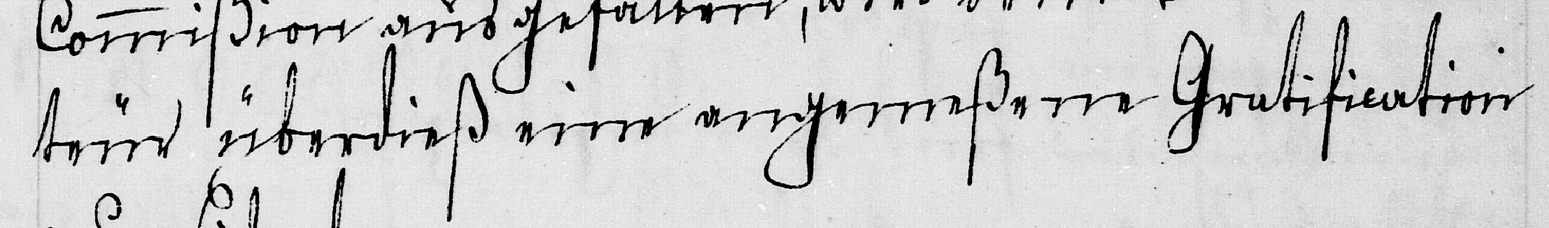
teur überdieß eine angemeßene Gratification
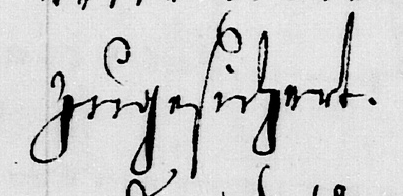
zugesichert.
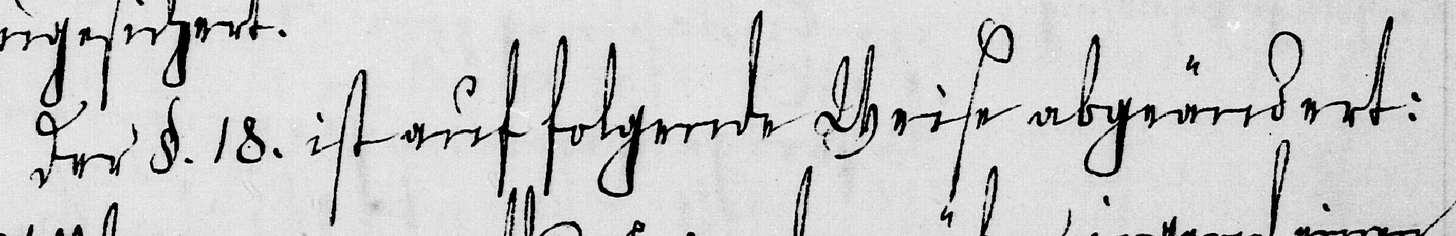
Der §. 18. ist auf folgende Weise abgeändert:
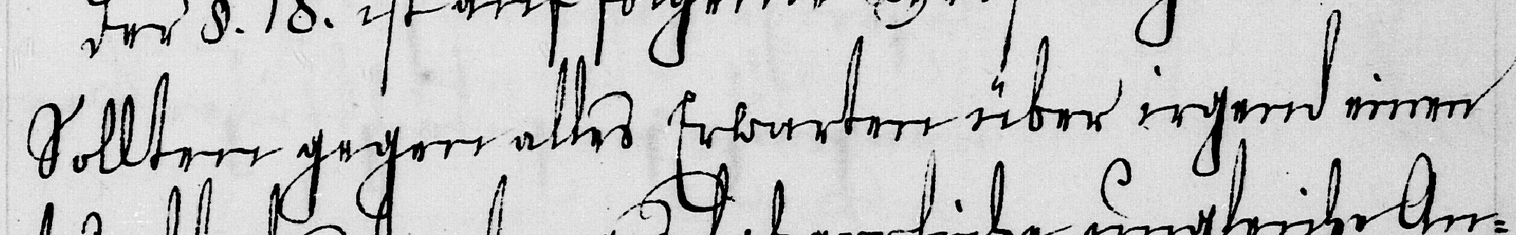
Sollten gegen alles Erwarten über irgend einen
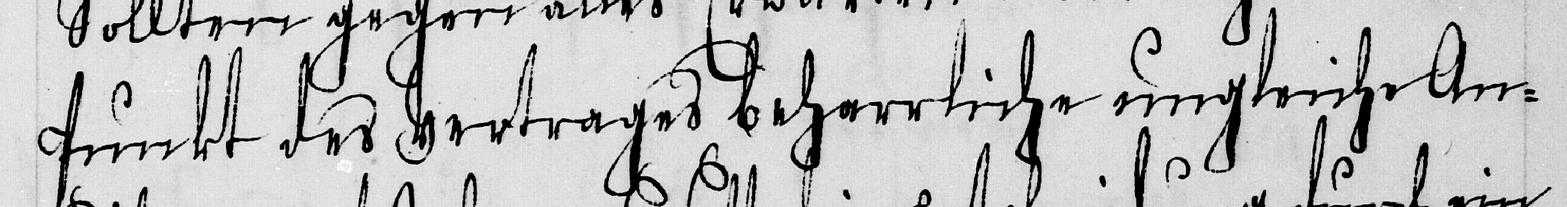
Punkt des Vertrages beharrlich ungleiche An¬
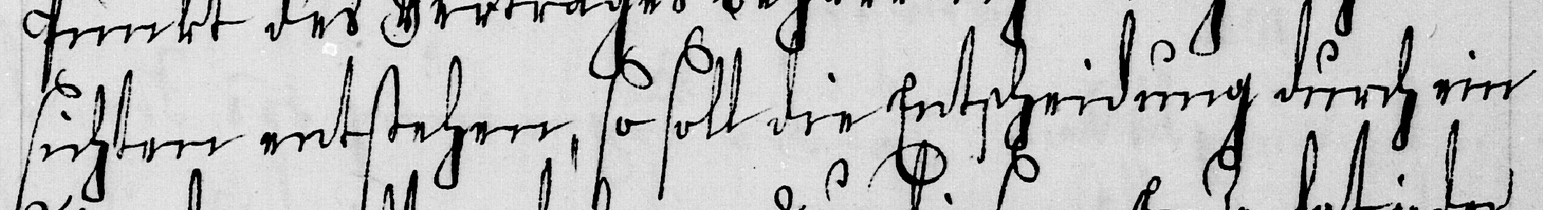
sichten entstehen, so soll die Entscheidung durch ein
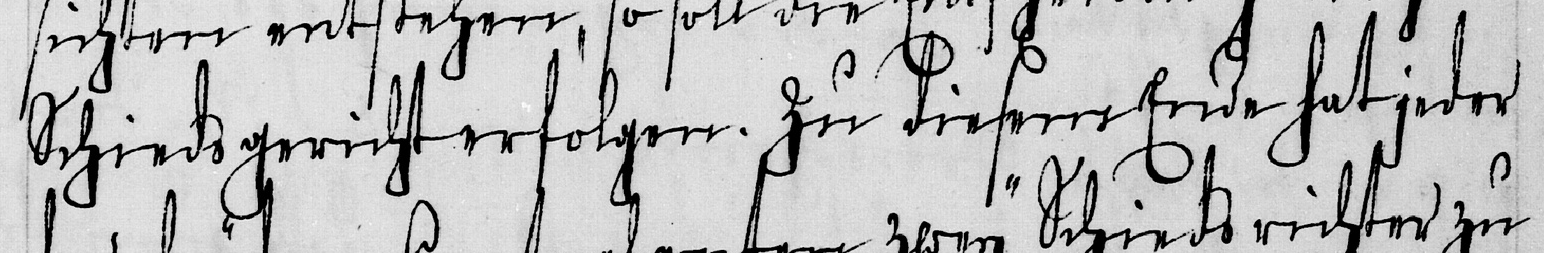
Schiedsgericht erfolgen. Zu diesem Ende hat jeder
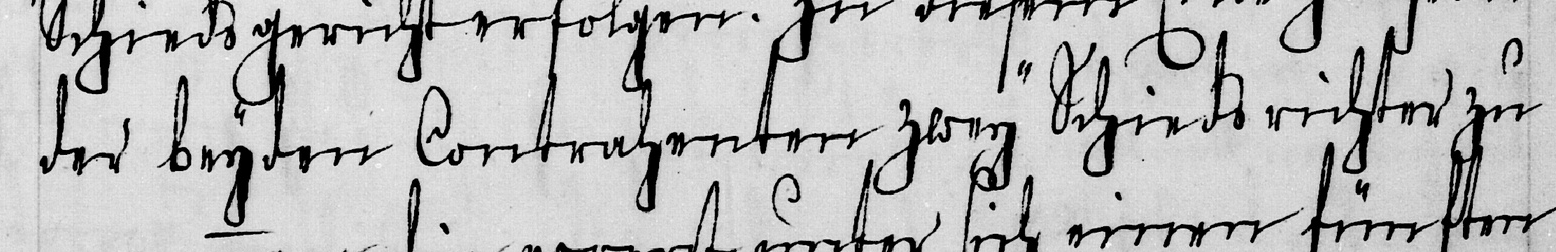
der beyden Contrahenten zwey Schiedsrichter zu
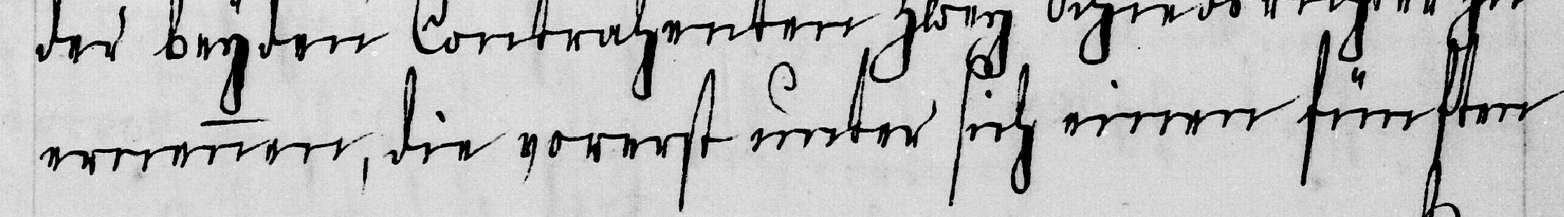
ernennen, die vorerst unter sich einen fünften
